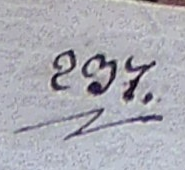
237.
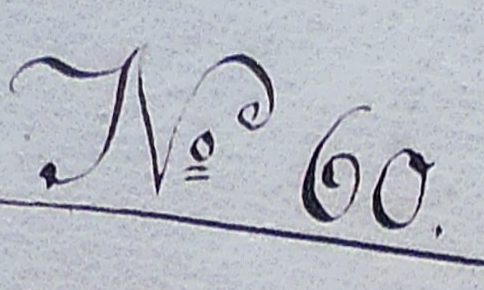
No͇ 60.
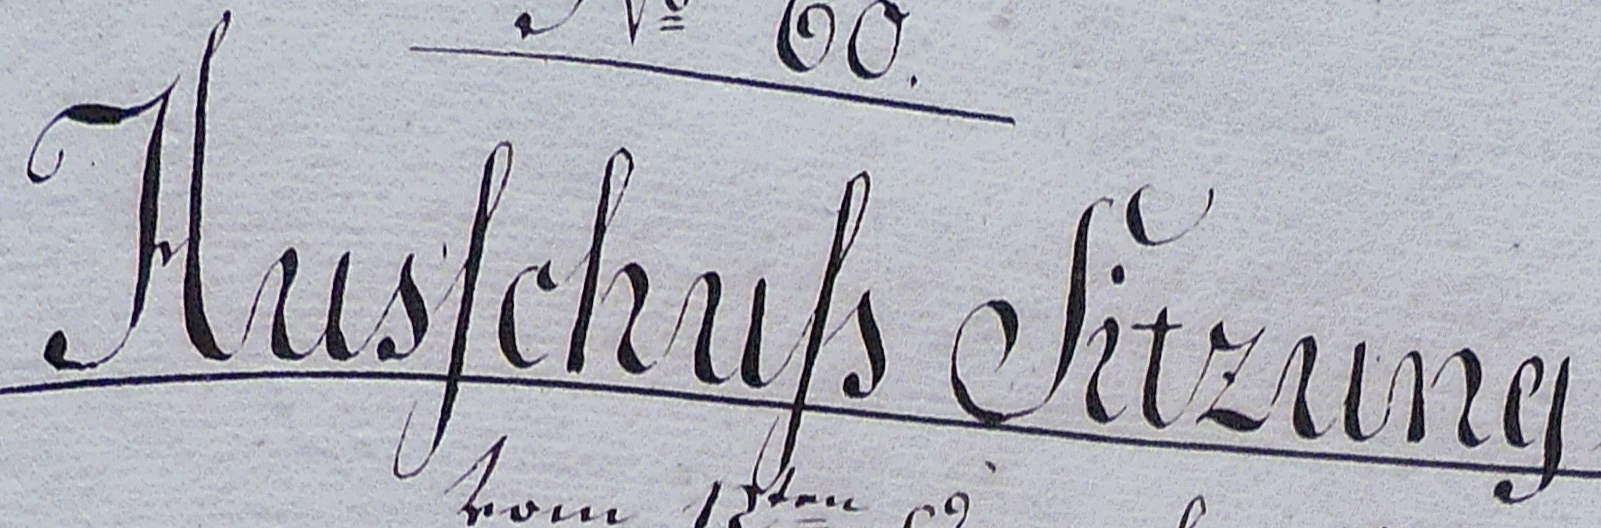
Ausschuss Sitzung
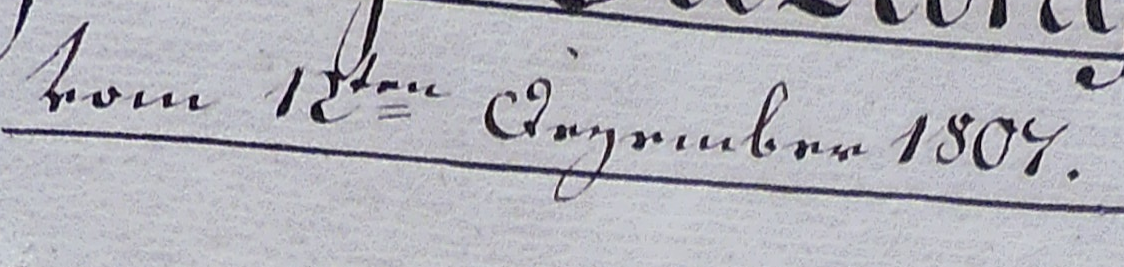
vom 12te͇n Dezember 1807.
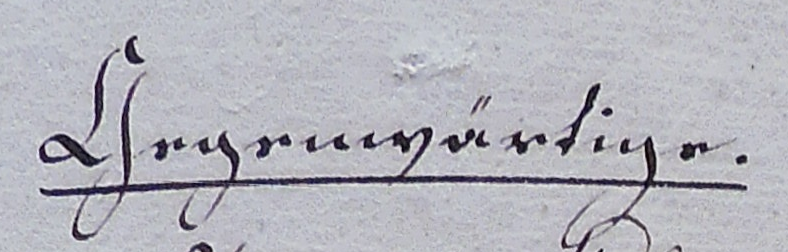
Gegenwärtige.
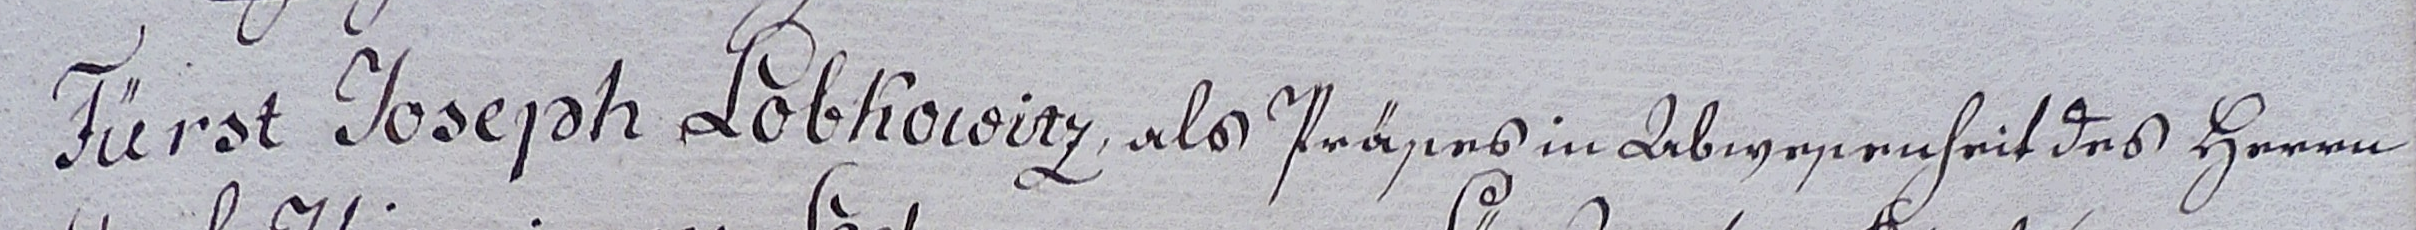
Fürst Joseph Lobkowitz, als Präses in Abwesenheit des Herrn
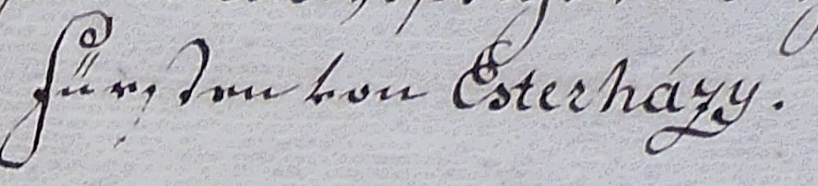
Fürsten von Esterházy.
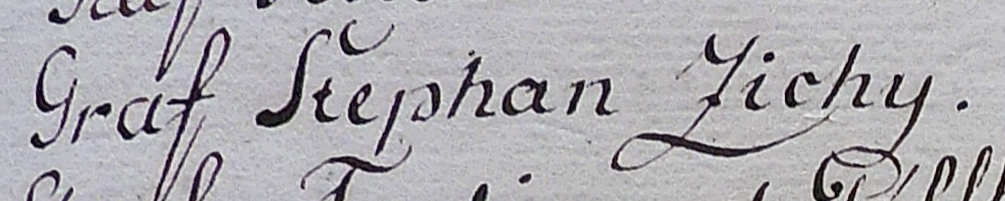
Graf Stephan Zichy.
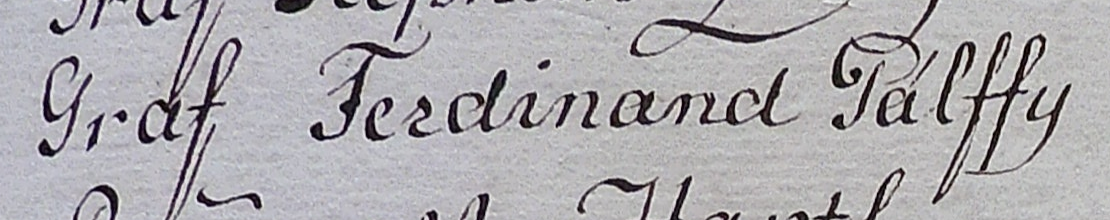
Graf Ferdinand Pálffy
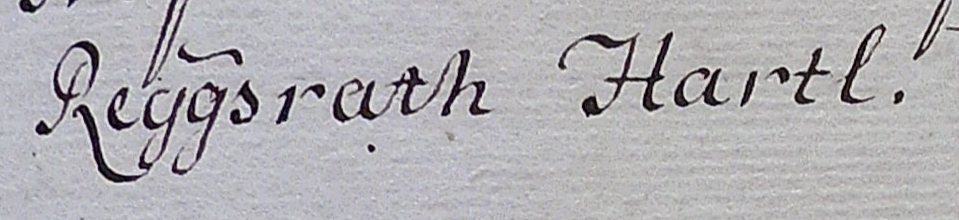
Reg͞gsrath Hartl.
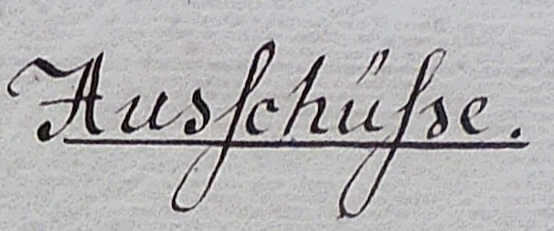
Ausschüsse.
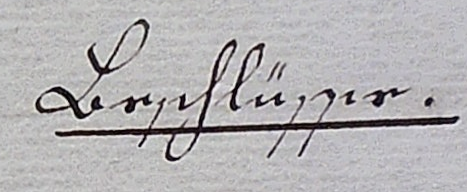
Beschlüsse.
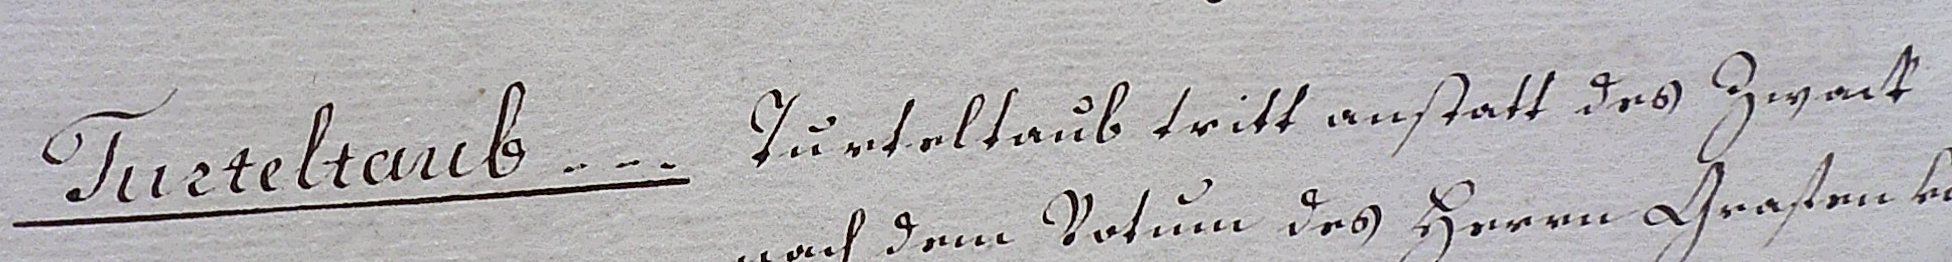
Turteltaub .. .. . Turteltaub tritt anstatt des Zwack
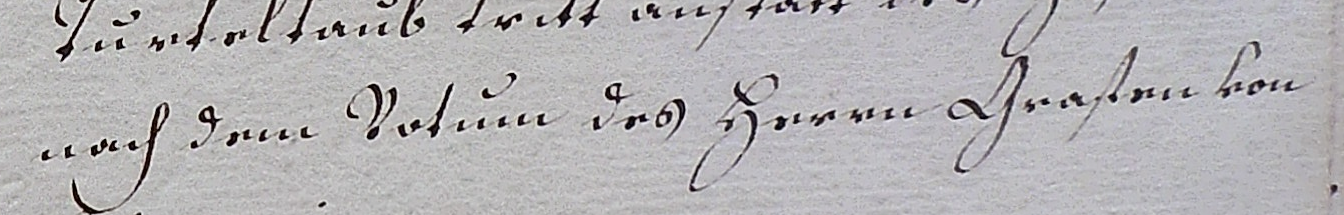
nach dem Votum des Herrn Grafen von
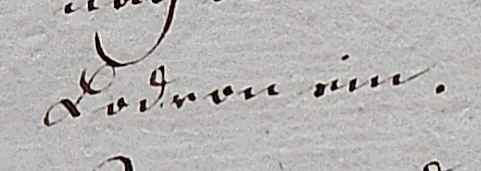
Lodron ein.
